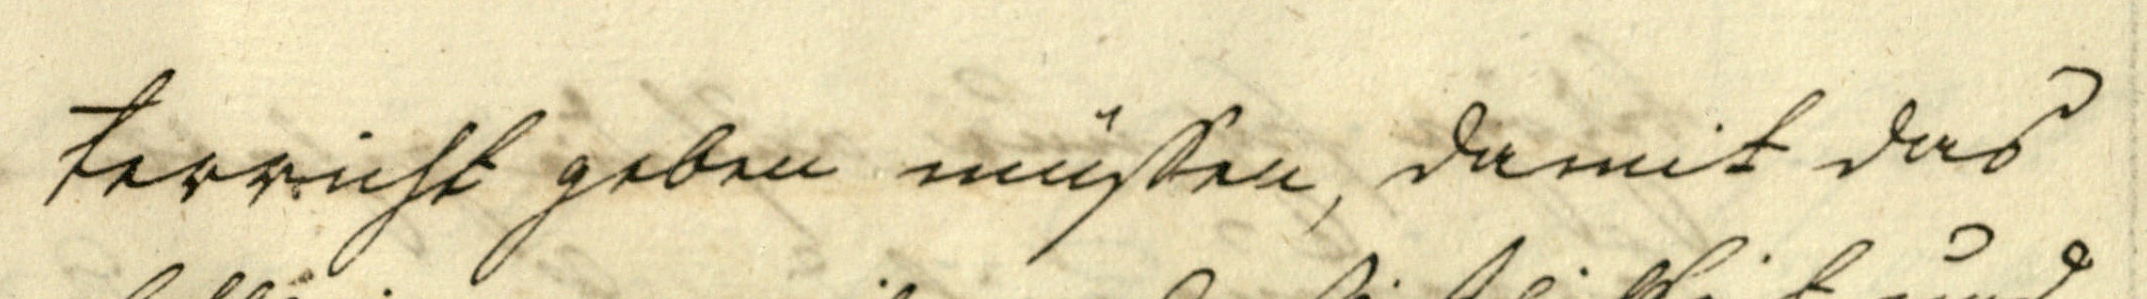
terricht geben müssen, damit das
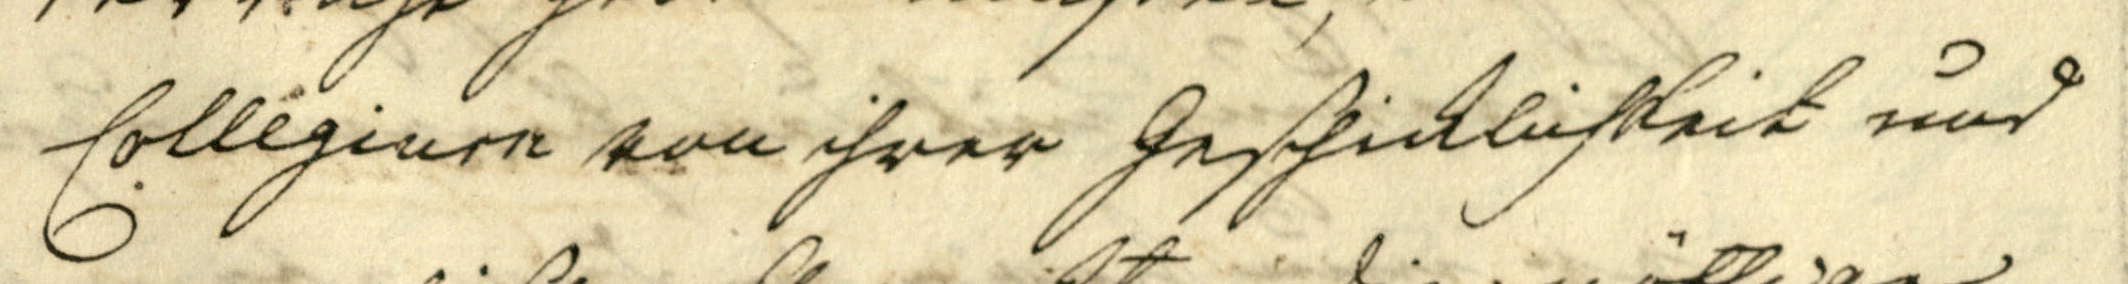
Collegium von ihrer Geschicklichkeit und
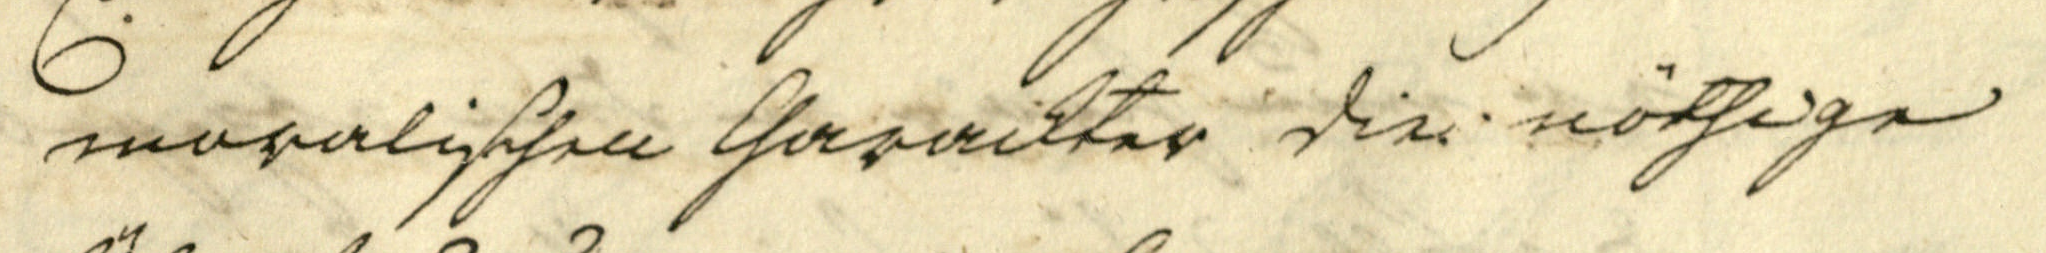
moralischen Charackter die nöthige
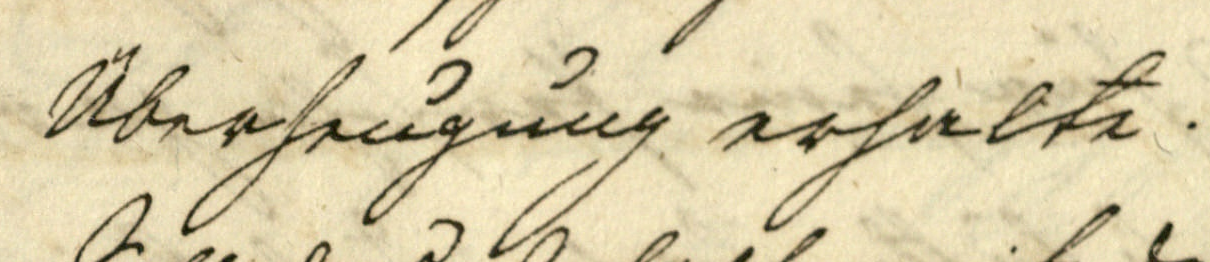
Überzeugung erhalte.
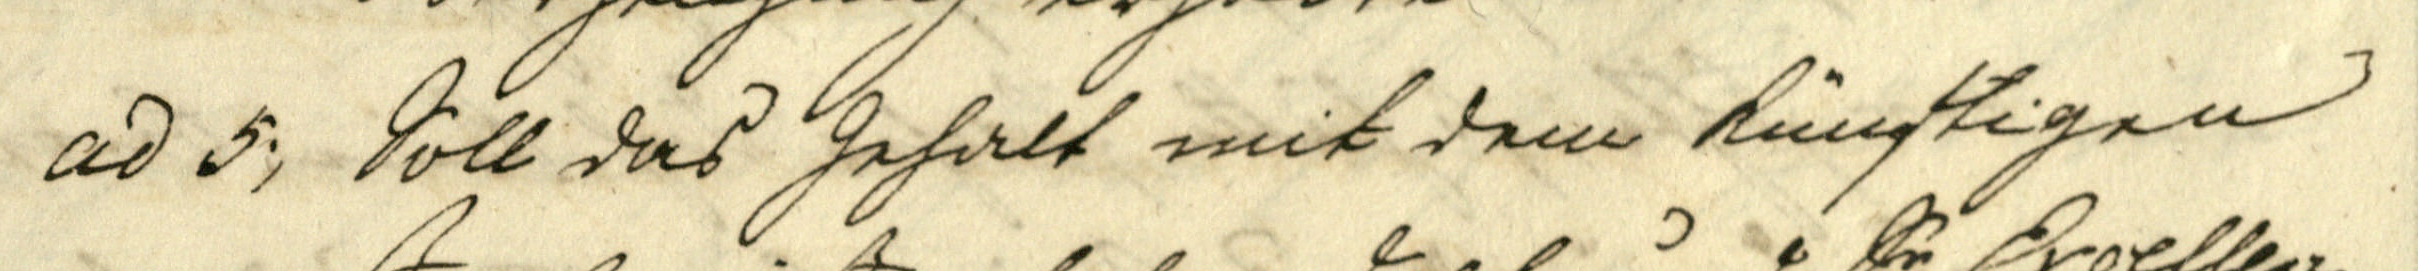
ad 5., soll das Gehalt mit dem künftigen
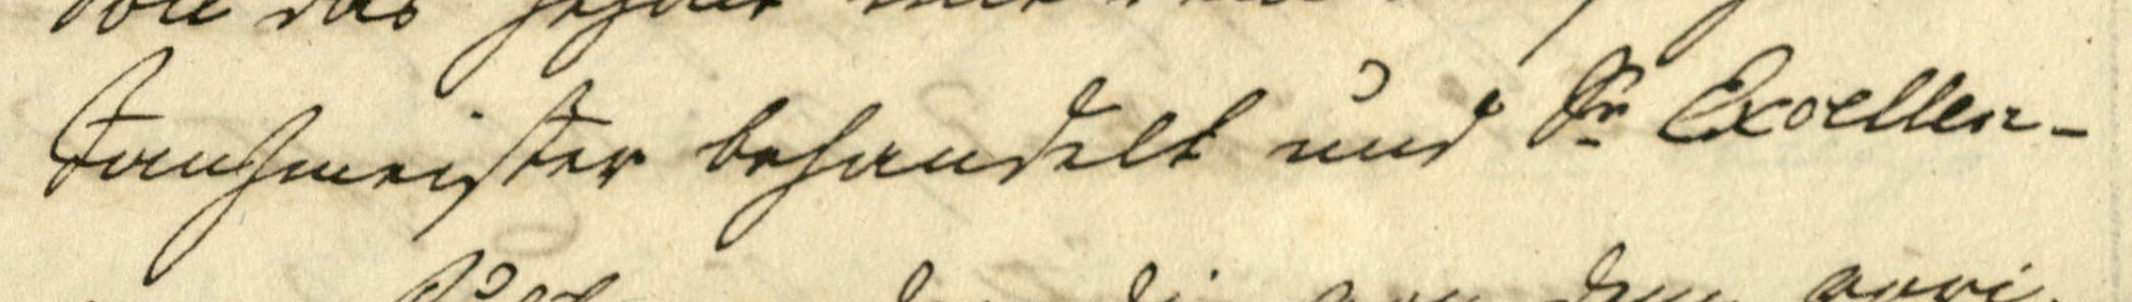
Tanzmeister behandelt und Sr Excellen¬
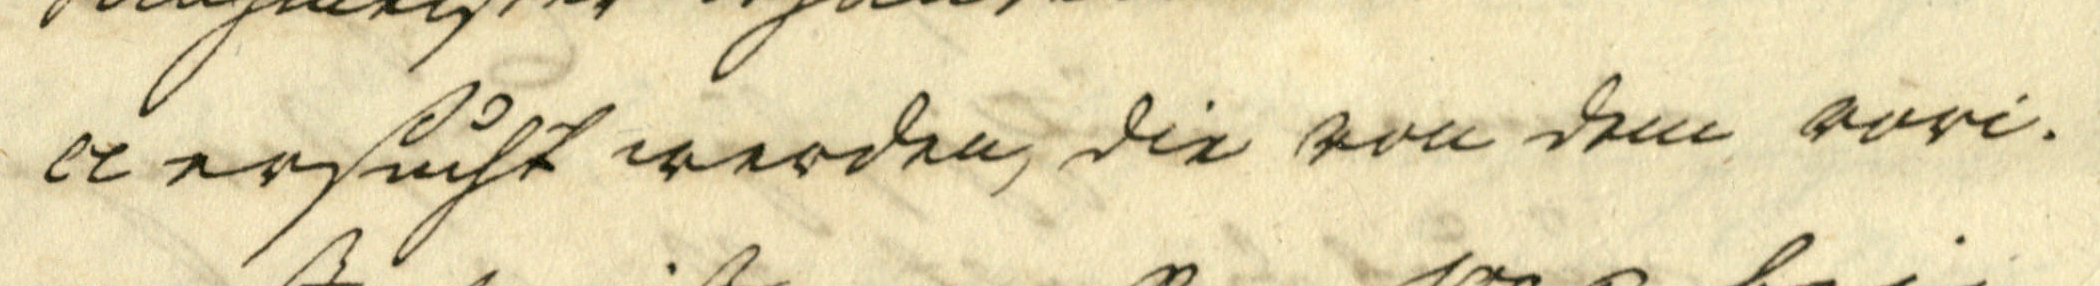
ce ersucht werden, die von dem vori¬
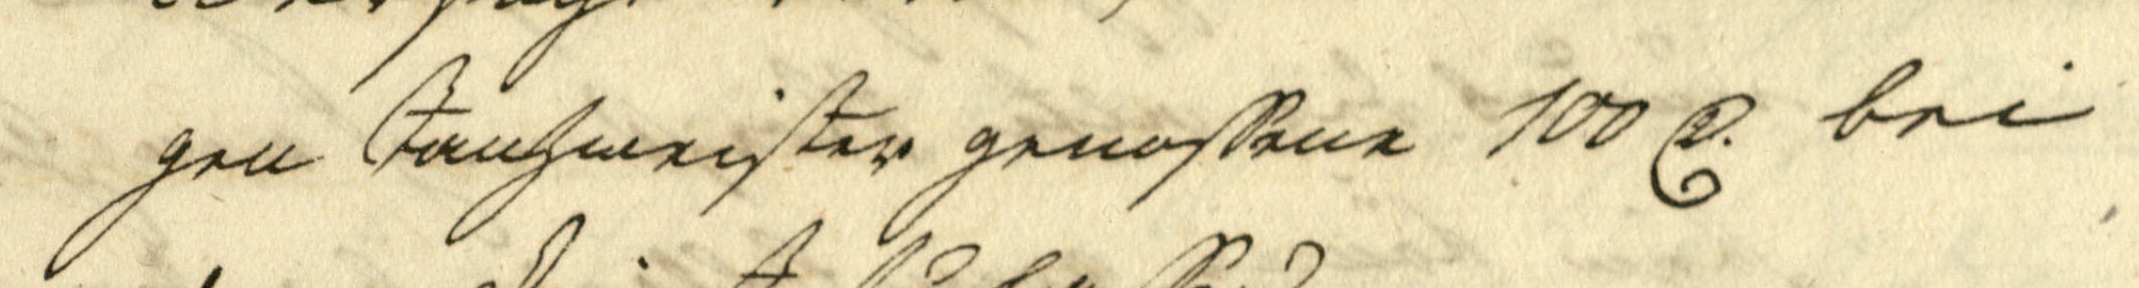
gen Tanzmeister genossene 100 l. bei
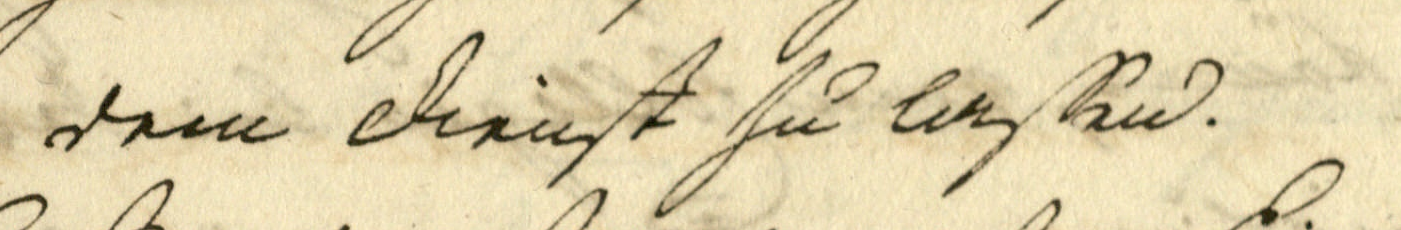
dem Dienst zu lassen.
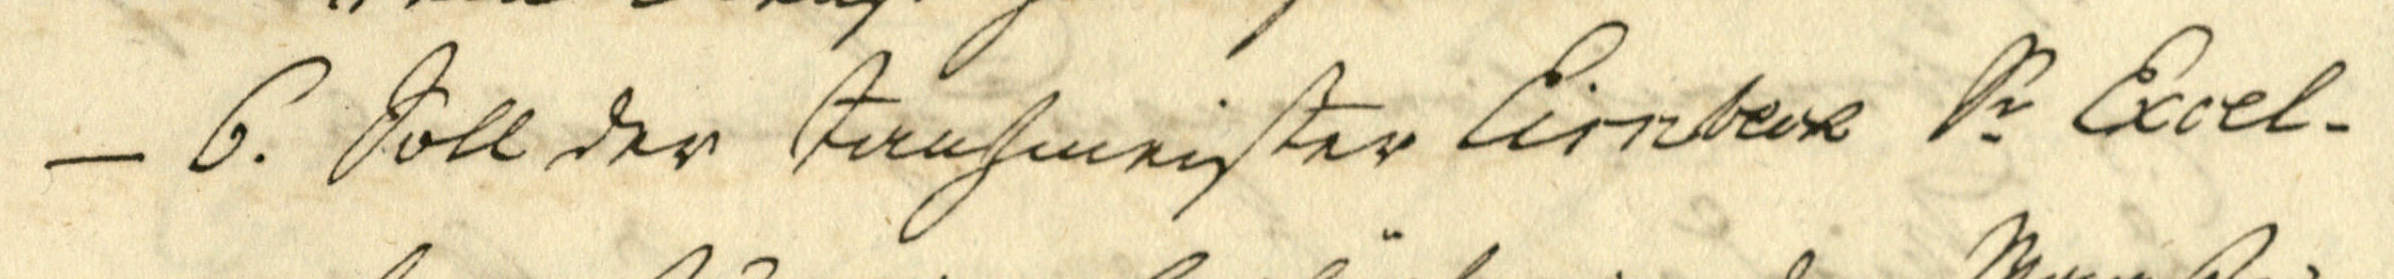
6. Soll der Tanzmeister Eimbeck Sr Excel¬
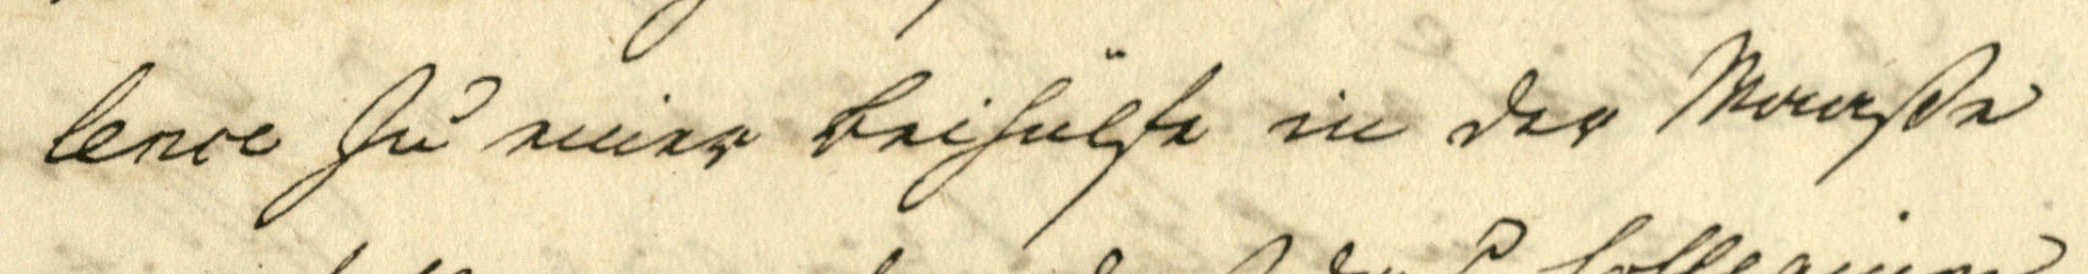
lence zu einer Beihülfe in der Maaße
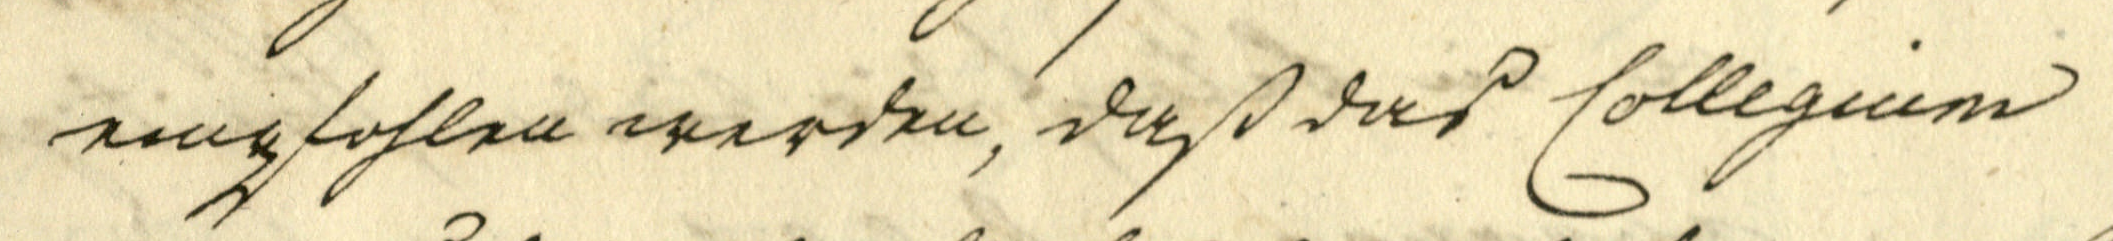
empfohlen werden, daß das Collegium
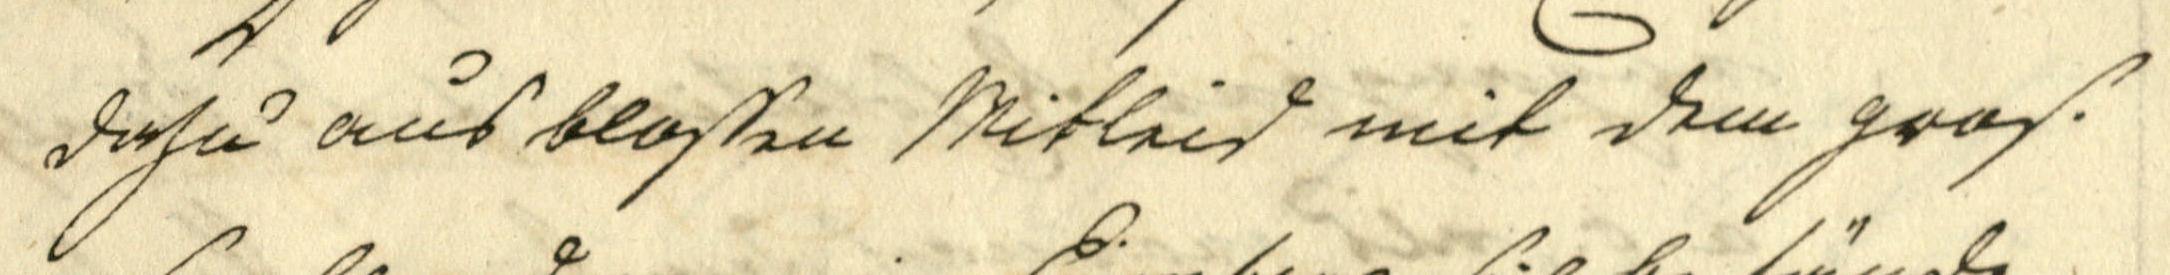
dazu aus blossen Mitleid mit dem gros¬
